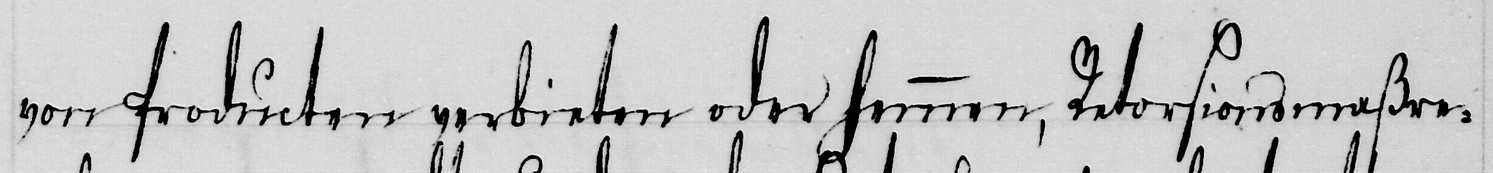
von Producten verbieten oder hemmen, Retorsionsmaßre¬
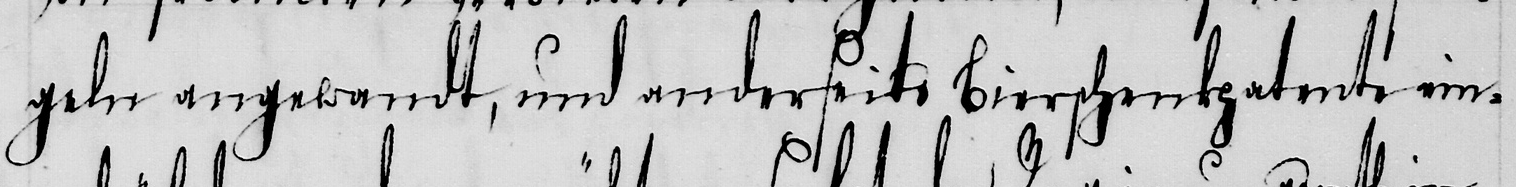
geln angewendet, und anderseits Bierschenkpatente ein¬
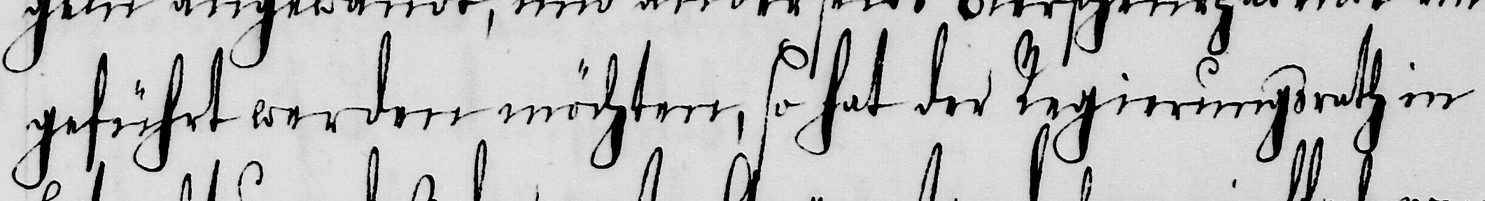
geführt werden möchten, so hat der Regierungsrath in
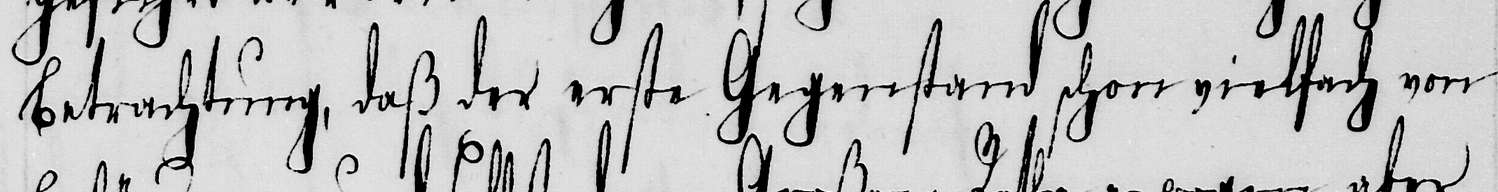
Betrachtung, daß der erste Gegenstand schon vielfach von
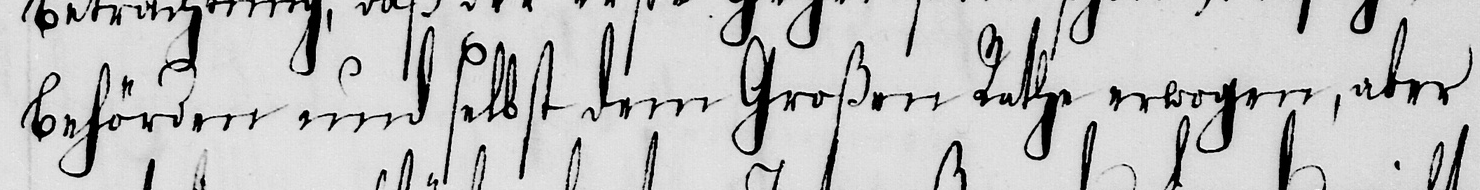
Behörden und selbst dem Großen Rathe erwogen, aber
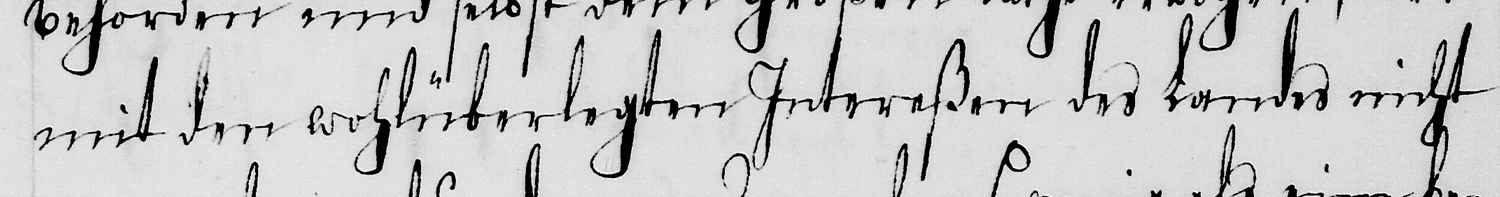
mit den wohlüberlegten Intereßen des Landes nicht
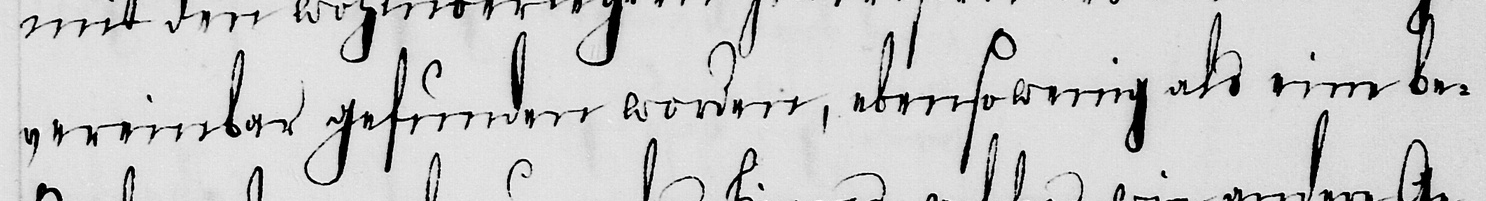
vereinbar gefunden worden, ebensowenig als eine be¬
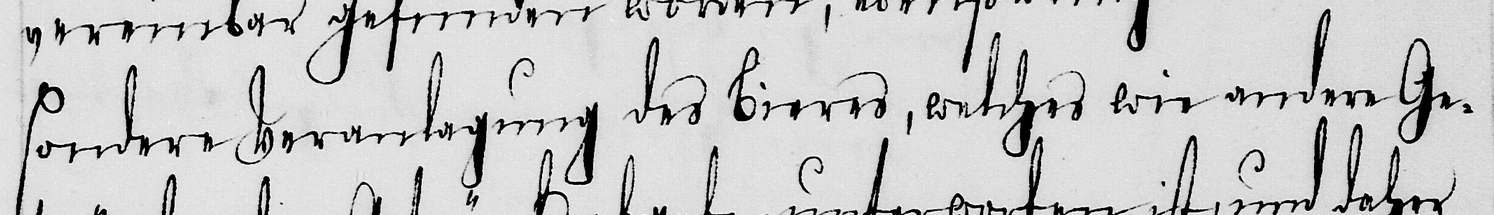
sondere Veranlagung des Bieres, welches wie andere Ge¬
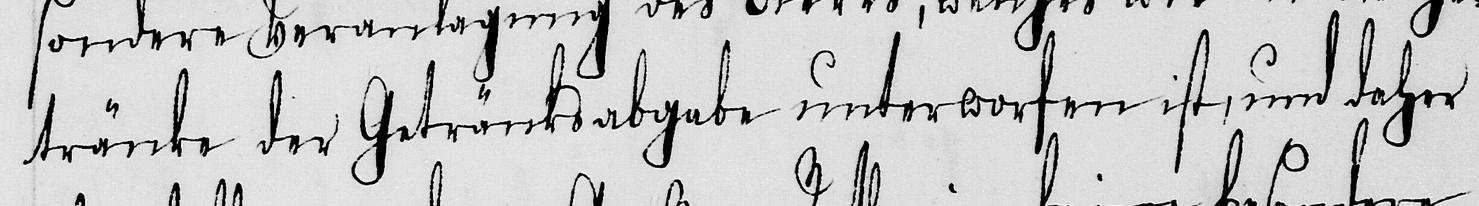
tränke der Getränksabgabe unterworfen ist, und daher
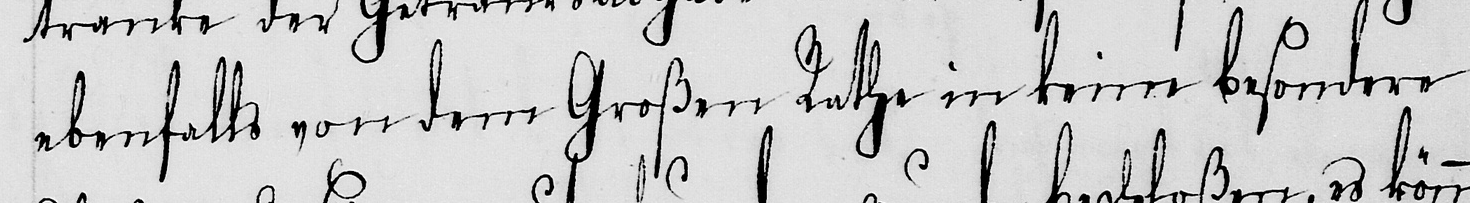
ebenfalls von dem Großen Rathe in keine besondere
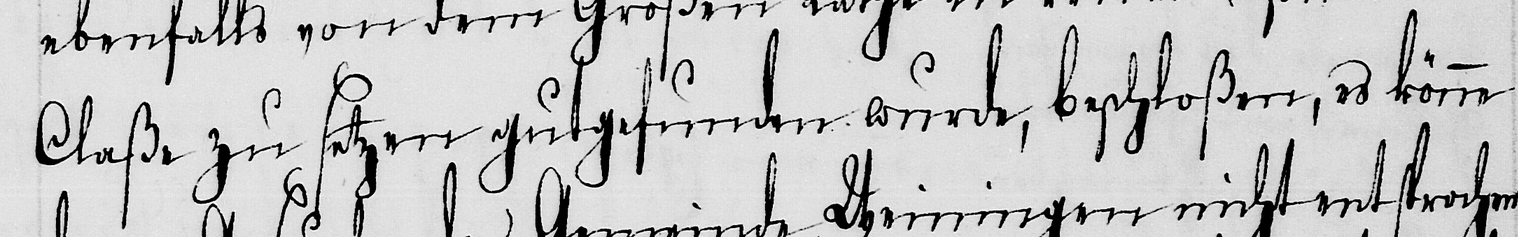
Claße zu setzen gutgefunden wurde, beschloßen, es könne
